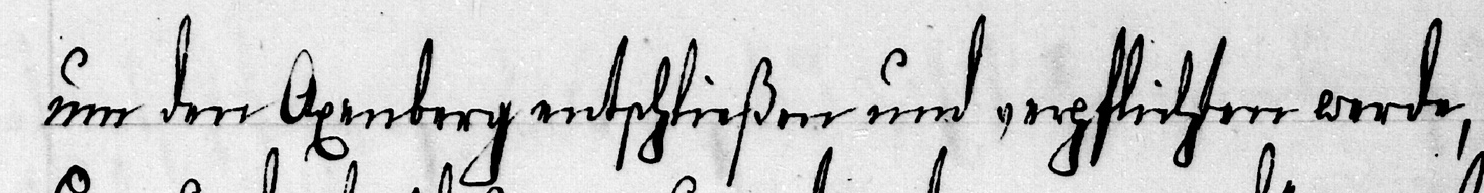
um den Axenberg entschließen und verpflichten werde,
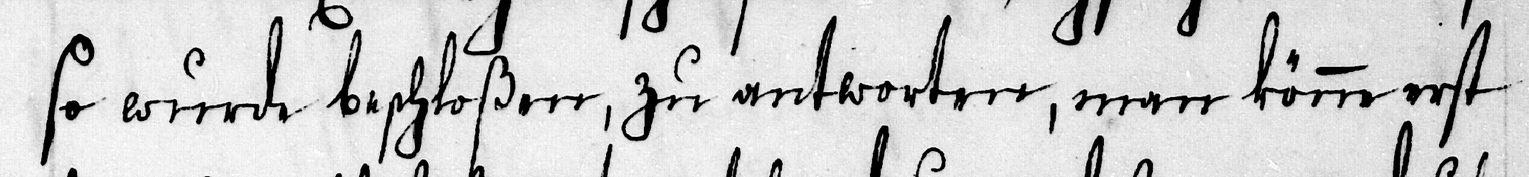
so wurde beschloßen, zu antworten, man könne erst
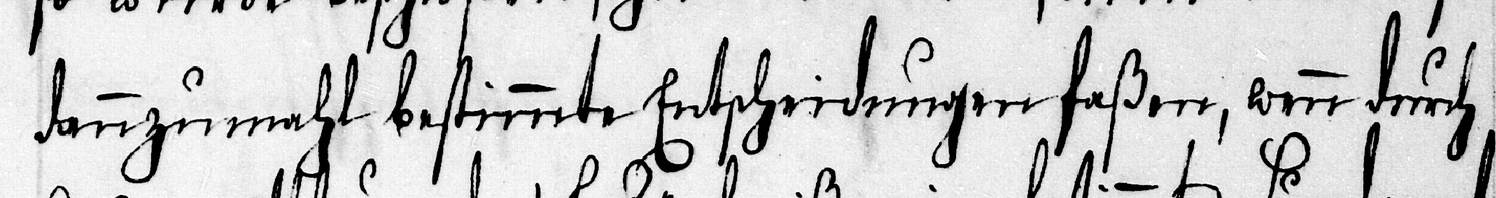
dannzumahl bestimmte Entscheidungen faßen, wenn durch
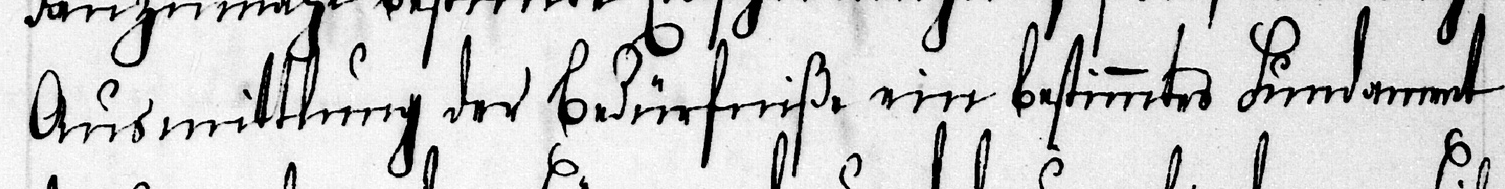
Ausmittlung der Bedürfniße ein bestimmtes Fundament
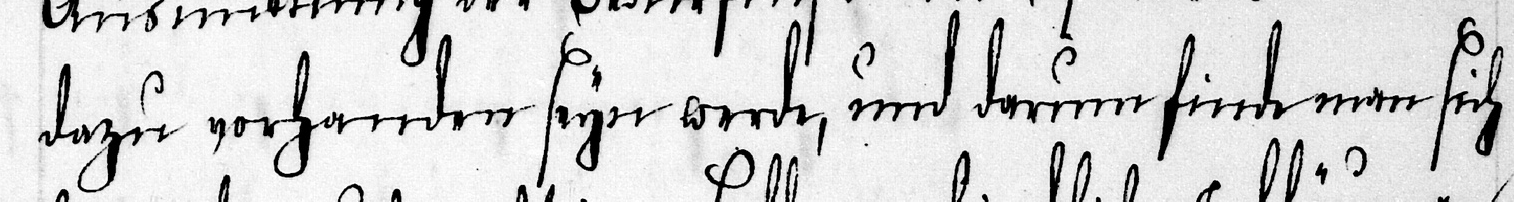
dazu vorhanden seyn werde, und darum finde man sich
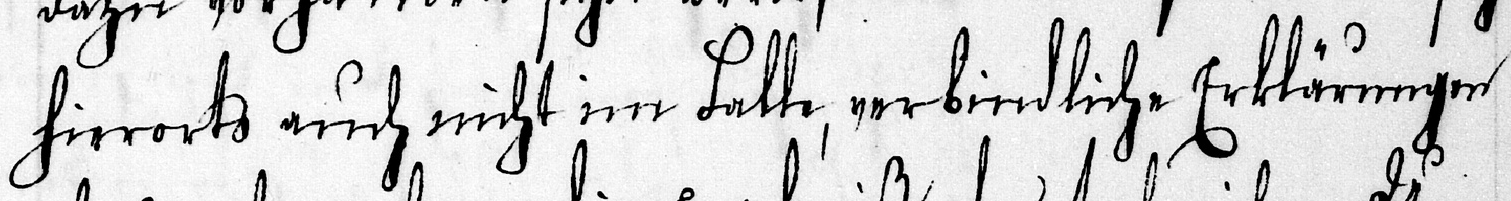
hierorts auch nicht im Falle, verbindliche Erklärungen
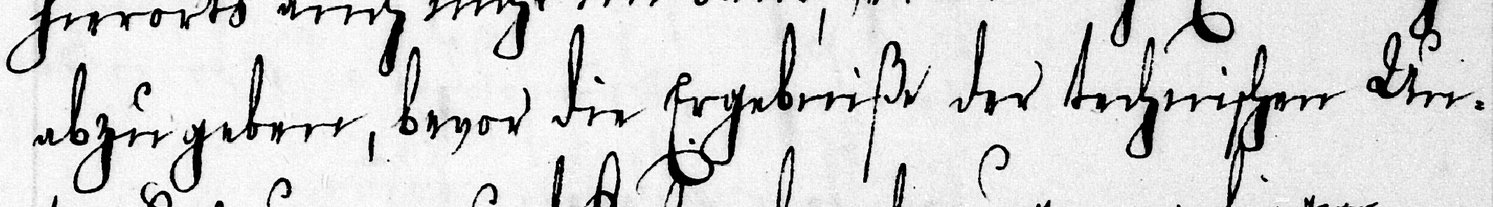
abzugeben, bevor die Ergebniße der technischen Un¬
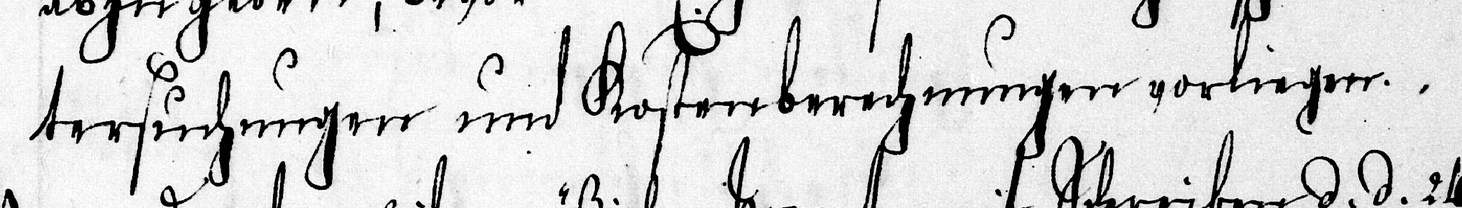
tersuchungen und Kostenberechnungen vorliegen.
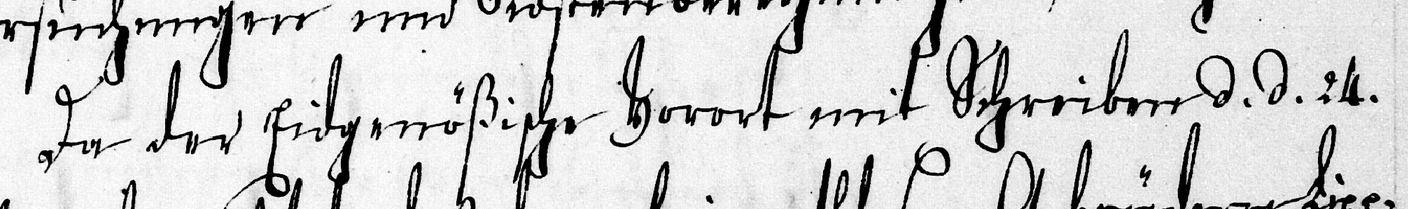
Da der Eidgenößische Vorort mit Schreiben d. d. 24.
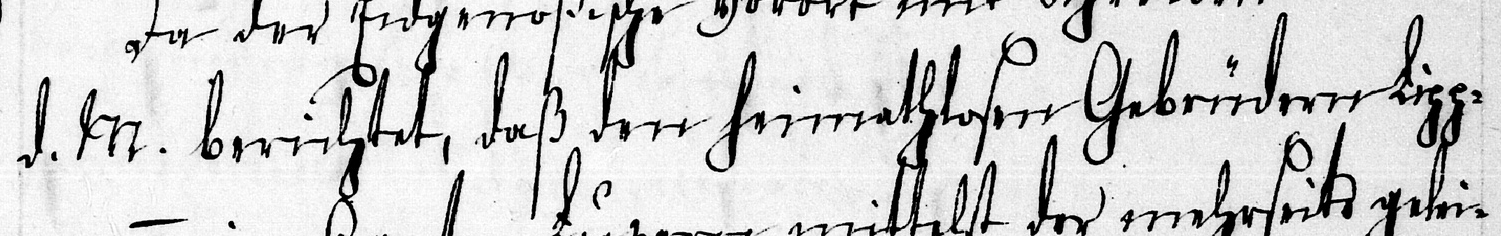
d. M. berichtet, daß den heimathlosen Gebrüdern Lip¬
